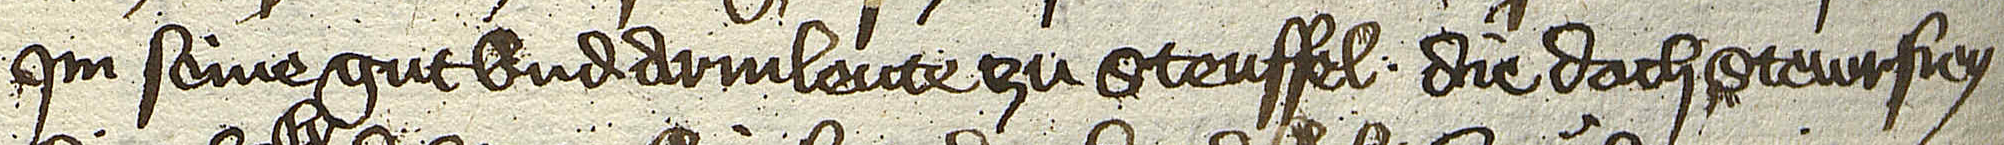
Im ſeine gut vnd Armleute cʒu Steuffel . die doch Stewrfrey
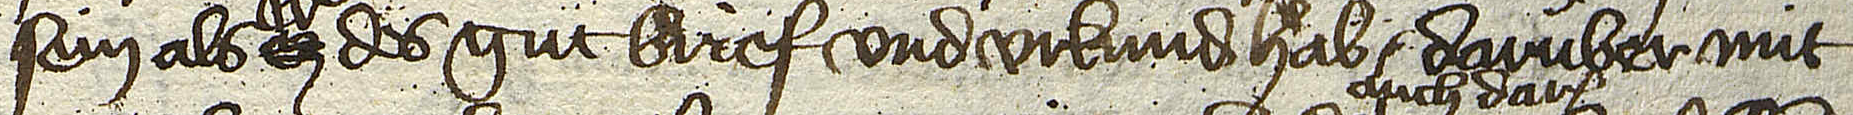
ſein als eʒ des gut brief vnd vrkund hab / darüber mit
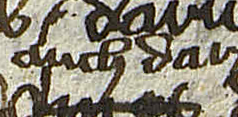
auch dar*
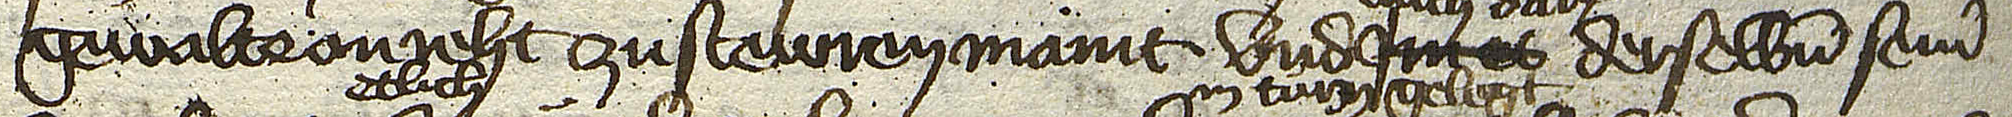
gewalte on reht cʒu ſtewren maint Vnd Im es derſelb*n ſein*
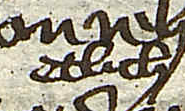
etlich
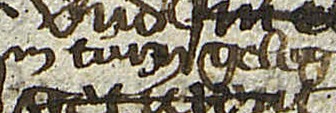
in turn gelegt
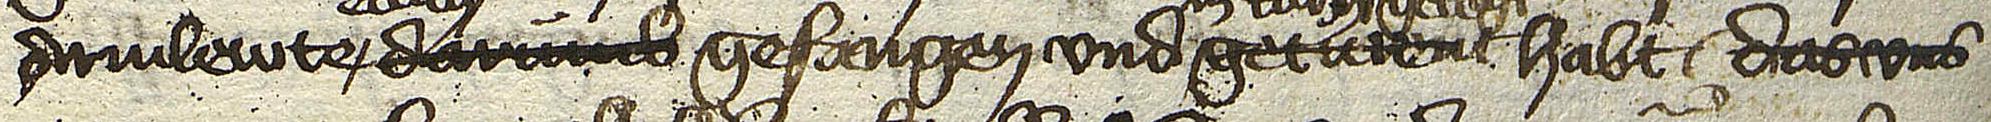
Armlewte darümb gefangen vnd geturent habt / das vns
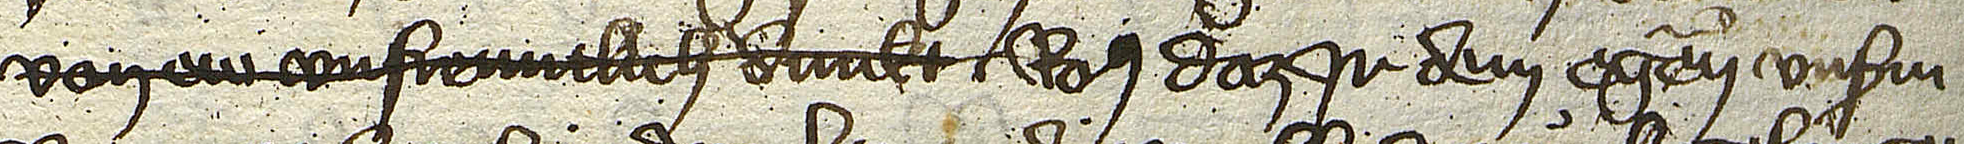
von ew vnfreuntlich dunkt / Ro* daʒ Ir dem egen* vnſ*m
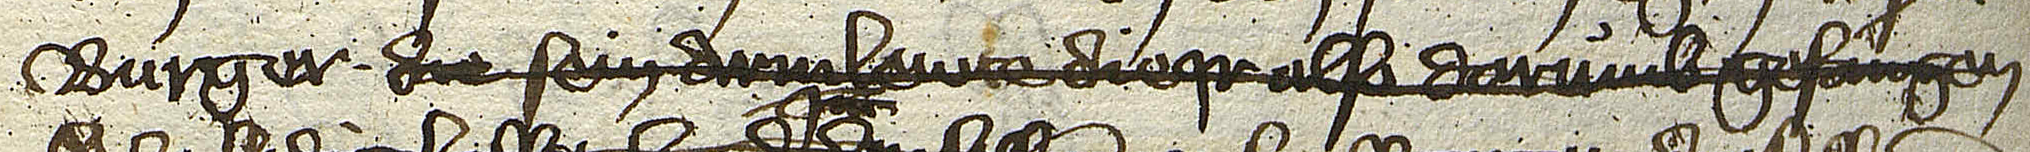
Burger . die ſein Armlewte die Ir alſo darümb gefangen
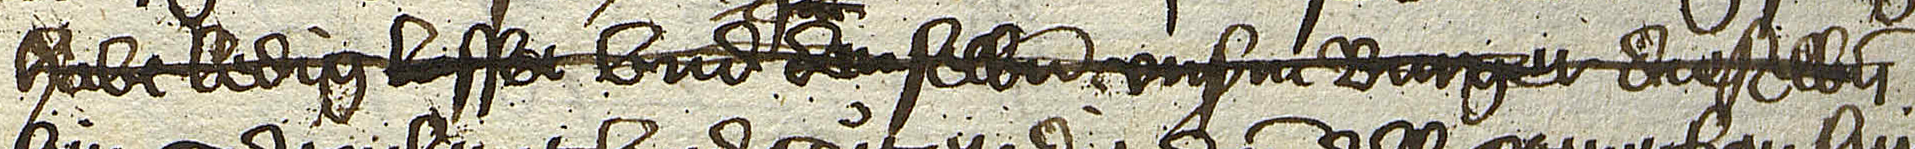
habt ledig laſſen vnd demſelb*n vnſ*m Burger dieſelb*n
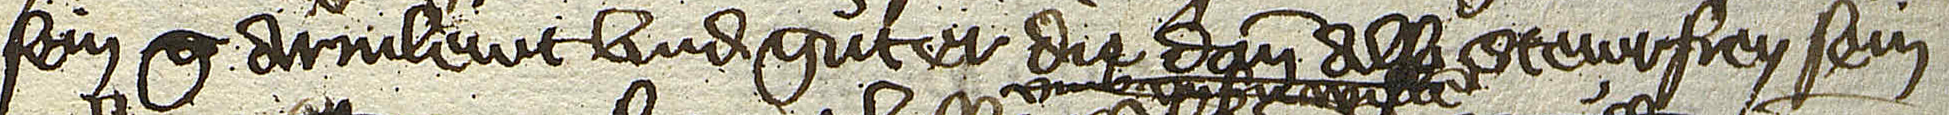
ſein g Armlewt vnd güter die dan* Alſo Stewfrey ſein
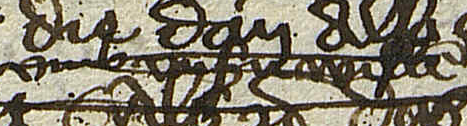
vmb vnſ*n wille*
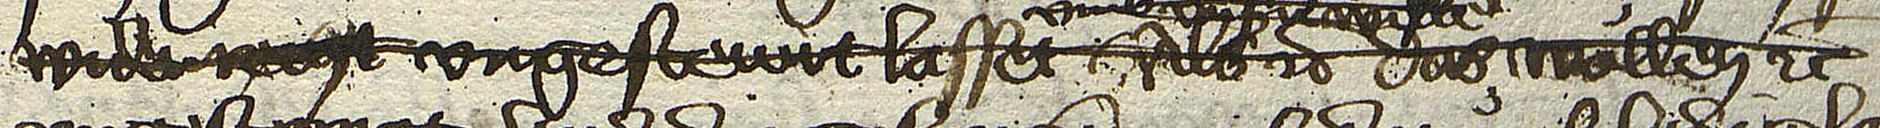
wider nicht vngeſtewrt laſſet / Als ec* das wöllen ec*
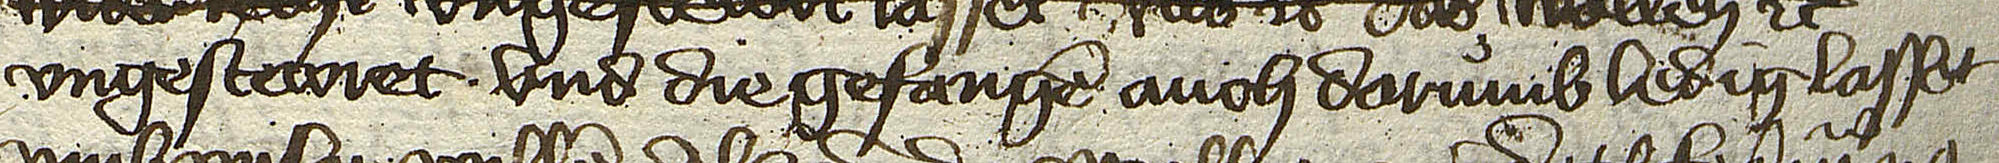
vngeſtewret . Vnd die gefange* auch darümb ledig laſſet
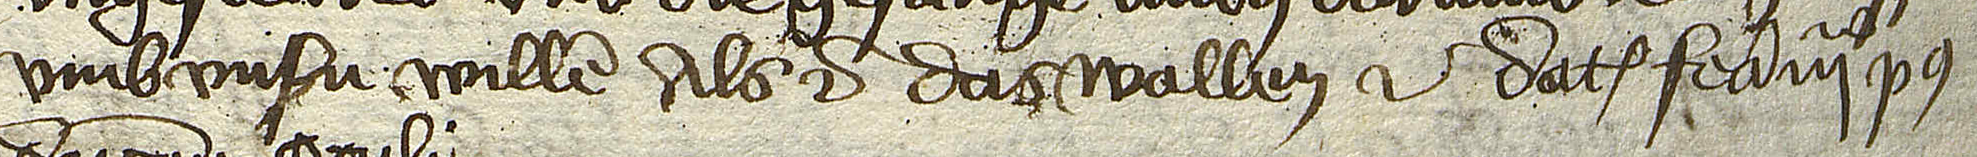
vmb vnſ*n wille* Als ec* das wollen ec* Dat* fe*a iii* p*
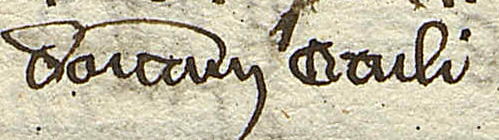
Do*icam Oculi
